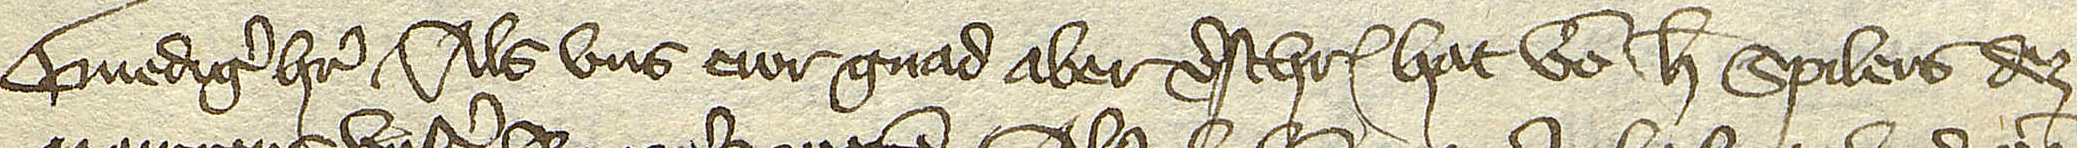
Gnedig* hr* / Als vns ewr gnad aber v*ſchr* hat vo* h* Spilers deʒ
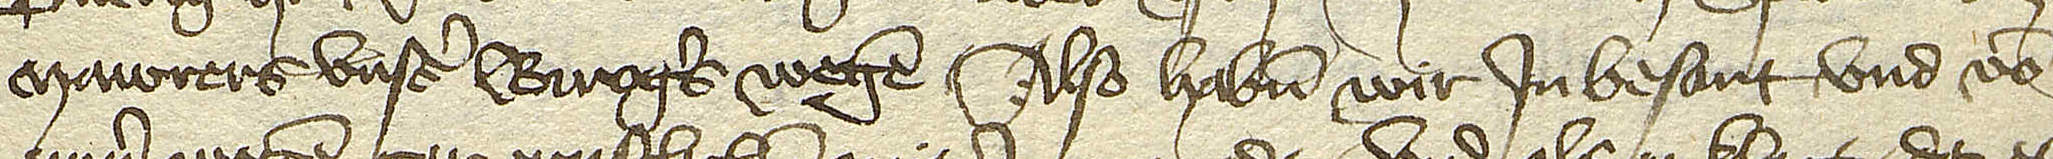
Mawrens vnſs* Burgs* wege* / Alſo habn* wir In beſant / vnd vo*
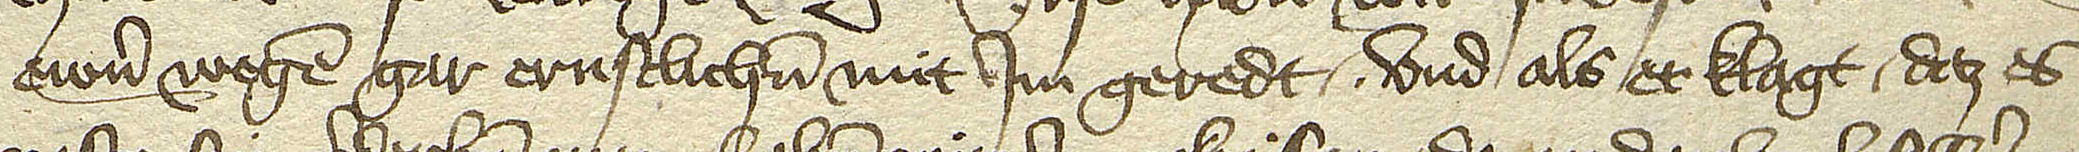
ewn* wege* gar ernſtlichn* mit Im geredt / . vnd als er klagt / daʒ es
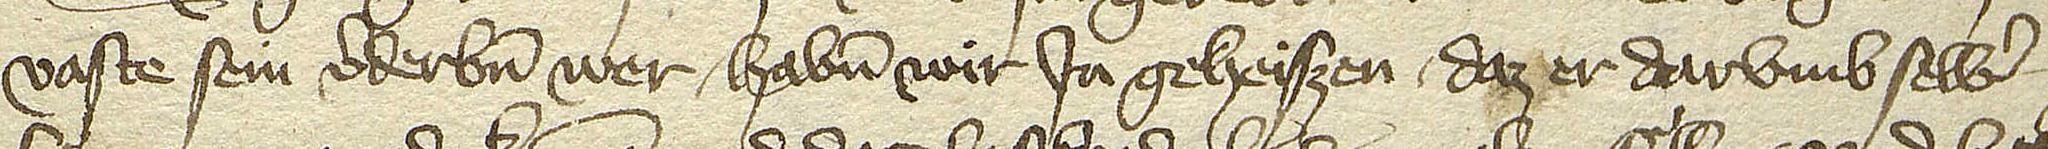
vaſte ſein v*derbn* wer / habn* wir In geheiſʒen / daʒ er darvmb ſelb*
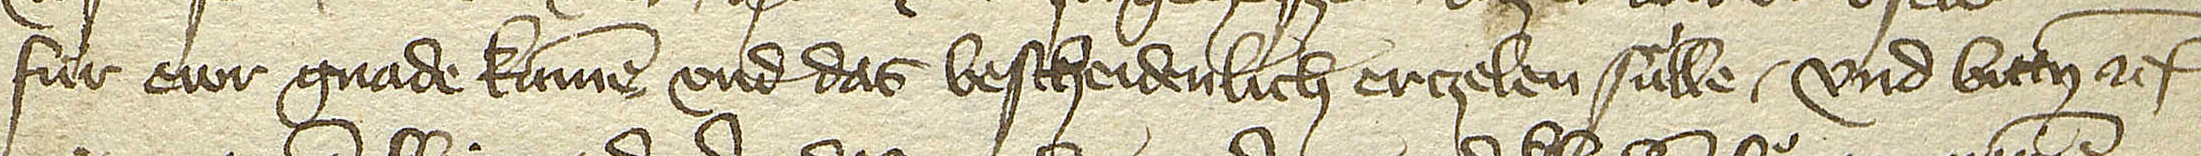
für ewr gnade kume* vnd das beſcheidenlich ercʒelen ſülle / vnd bittn* ec*
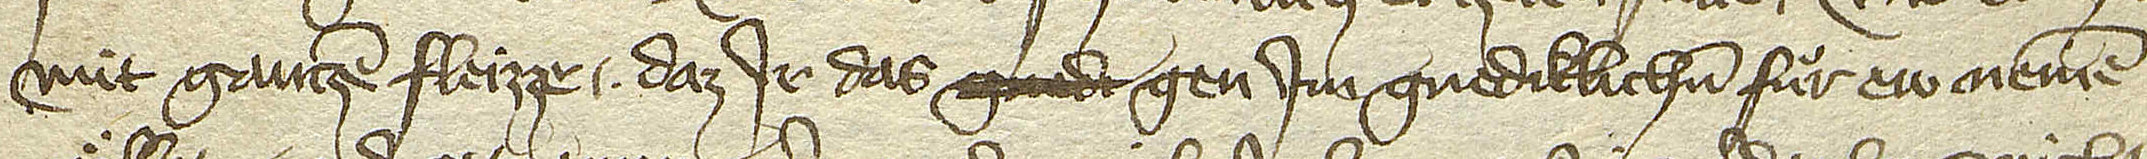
mit gancʒe* fleiʒʒe / . daʒ Ir das gnedi gen Im gnediklichn* für ew neme*
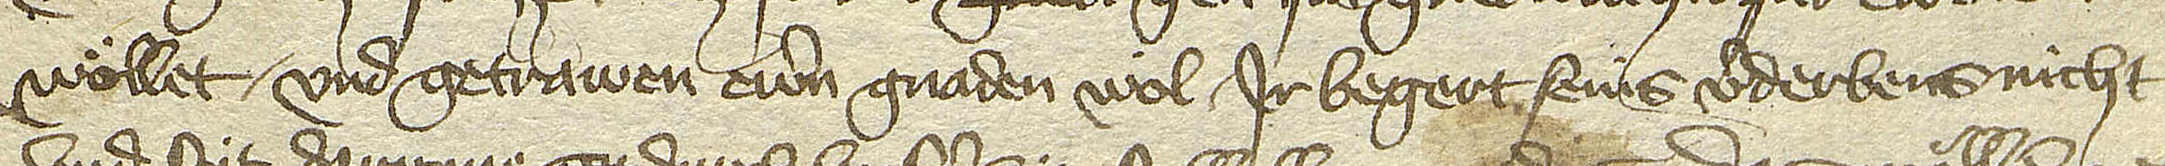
wöllet / vnd getrawen ewn* gnaden wol / Ir begert ſeins v*derbens nicht
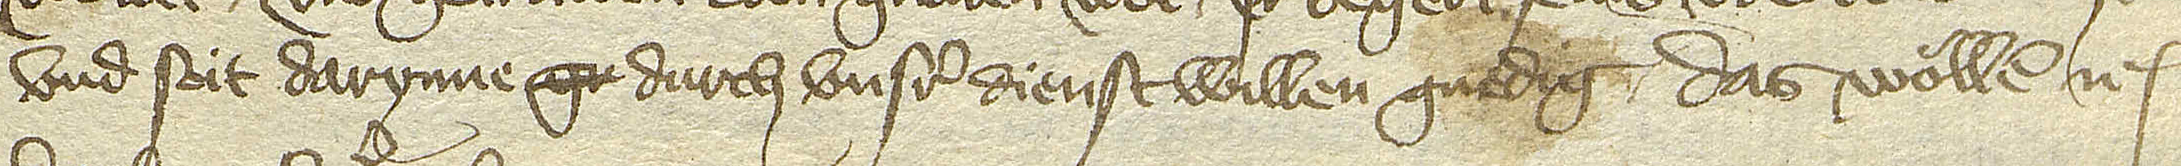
vnd ſeit darynne gr durch vnſr* dienſt willen gnedig / das wölle ec*
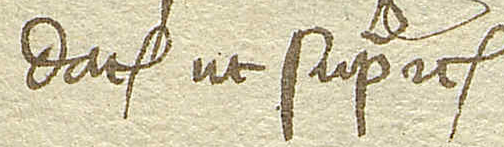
dat* ut ſup* ec*
